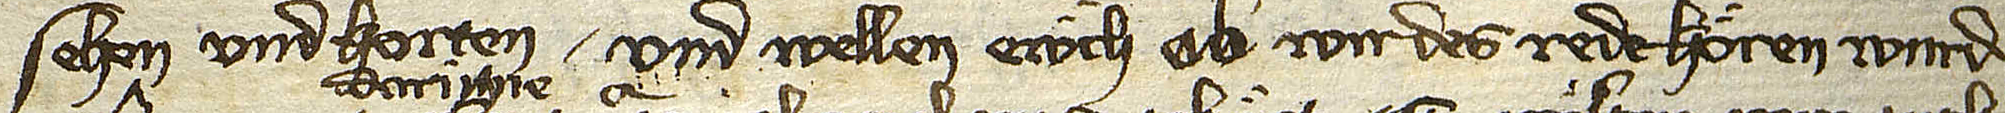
ſehen vnd horten / vnd wellen ewch ob wir des rede hören wurd*
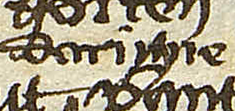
darinne
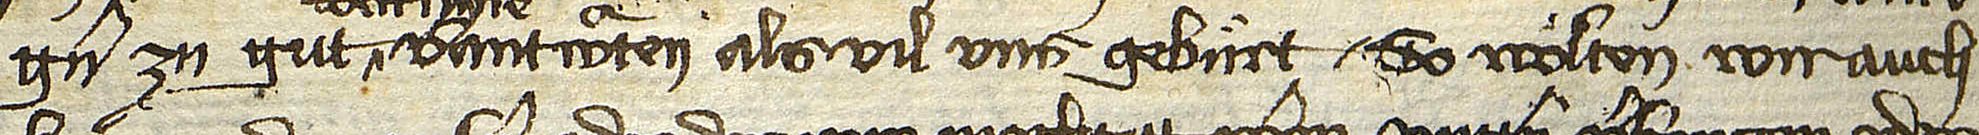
gn* ʒu gut v* antw*ten als vil vns gebürt / So wölten wir auch
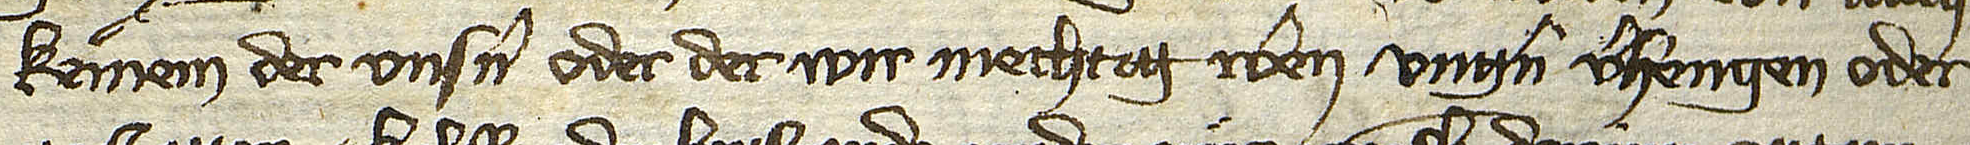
keinem der vnſn* oder der wir mechtig we*n vng*n v*hengen oder
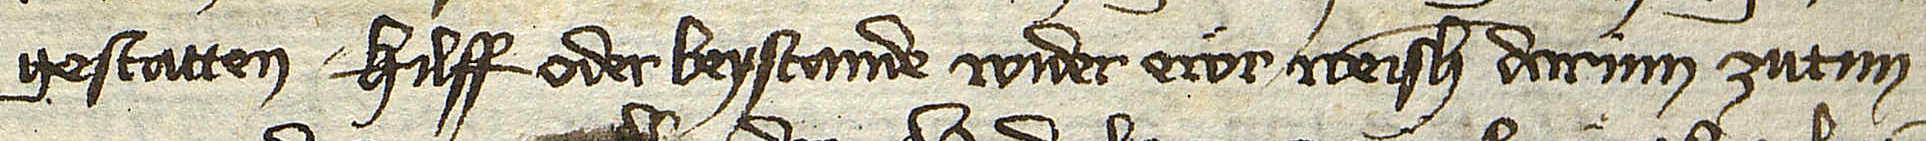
geſtatten / hilff oder beyſtande wider ewr weiſh* darinn ʒutun
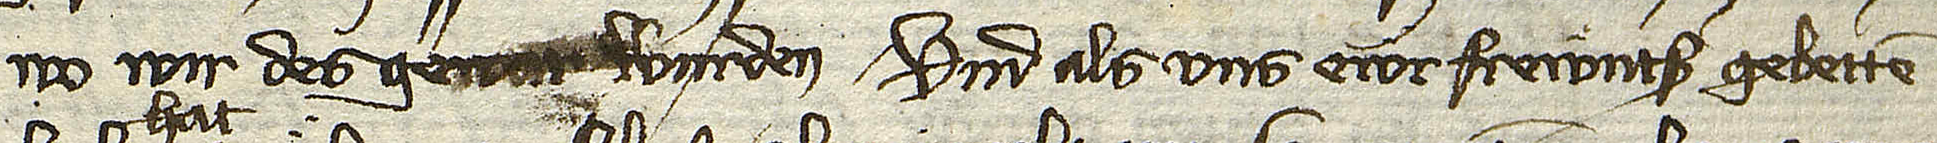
wo wir des gewar Wurden / Vnd als vns ewr frewntſ* gebette*
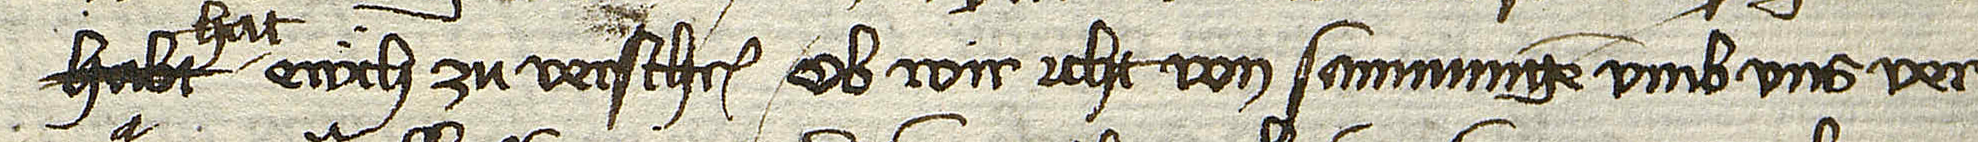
habt / ewch ʒu verſchr* / Ob wir icht von ſamnunge* vmb vns ver =
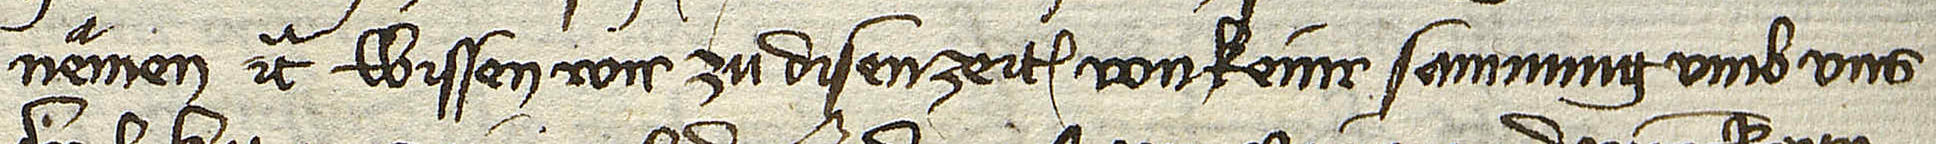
nëmen ec* Wiſſen wir ʒu diſenʒeit* von keinr ſamnung vmb vns
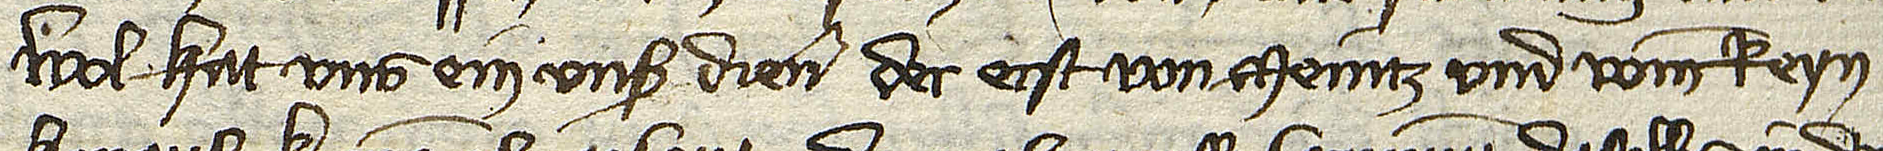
Wol hat vns ein vnſ* dien* der erſt von Meincʒ vnd vom* Reyn
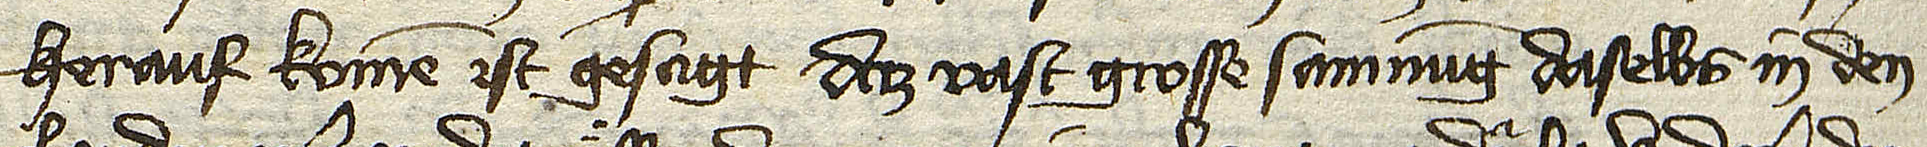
herauf kome* iſt geſagt / diʒ vaſt groſſe ſam*nug daſelbs in den
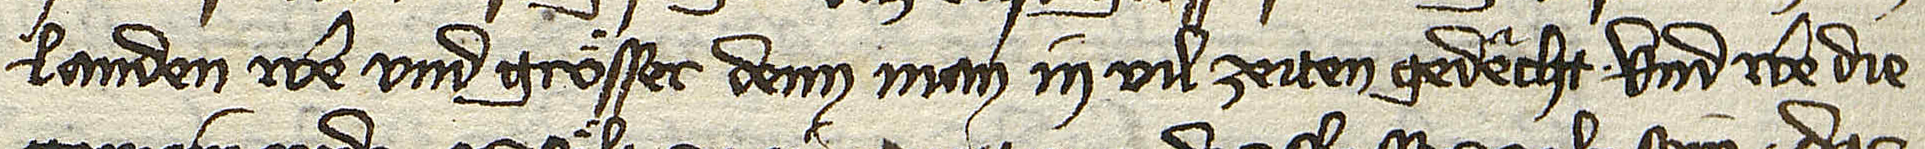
landen we* vnd gröſſer denn man in vil ʒeiten gedëcht . Vnd we* die
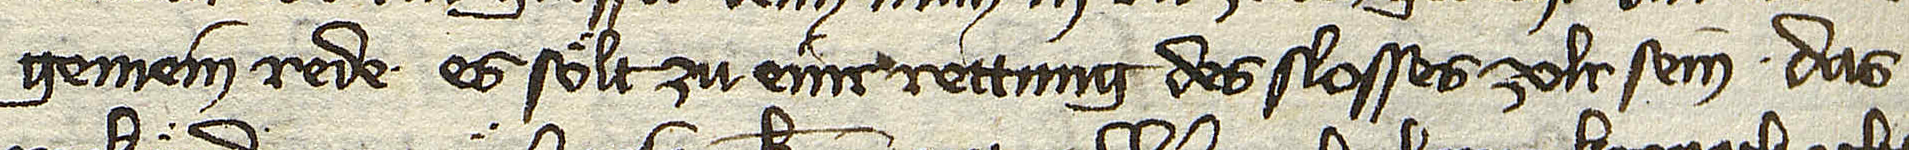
gemein rede . es ſölt ʒu einr rettung des ſloſſes ʒolr ſein. das
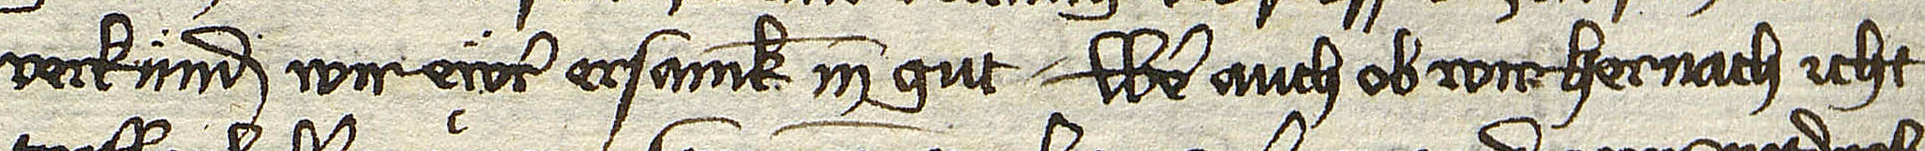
verkünd* wir ewr erſamk* in gut / We* auch ob wir hernach icht
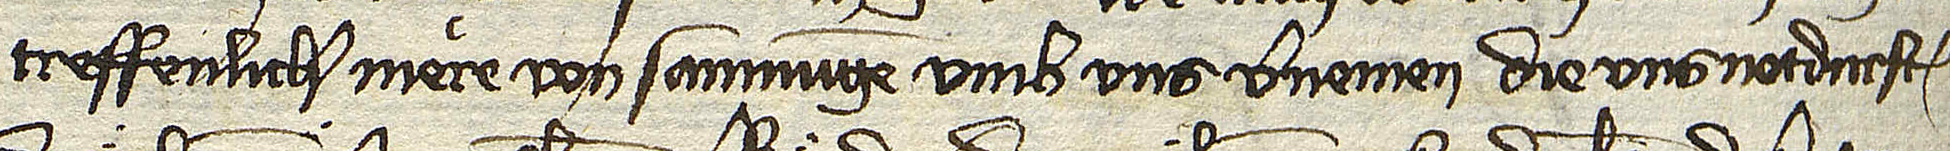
treffenlich* mëre von ſamnuge* vmb vns v*nemen die vns notdurft*
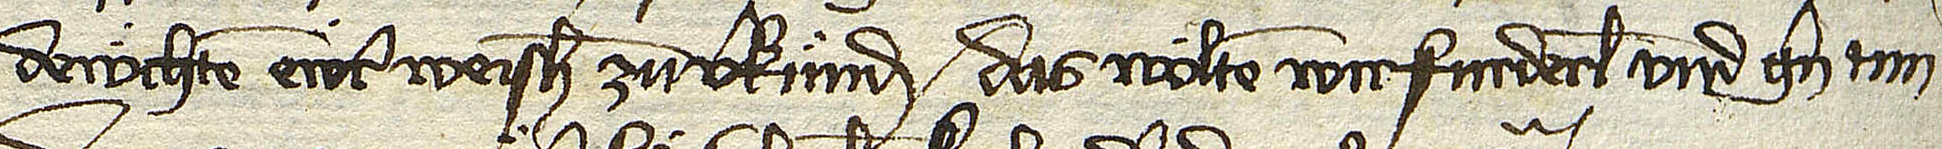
dewchte* ewr weiſh* ʒu v*künd* / das wölte* wir furderl* vnd g*n tun
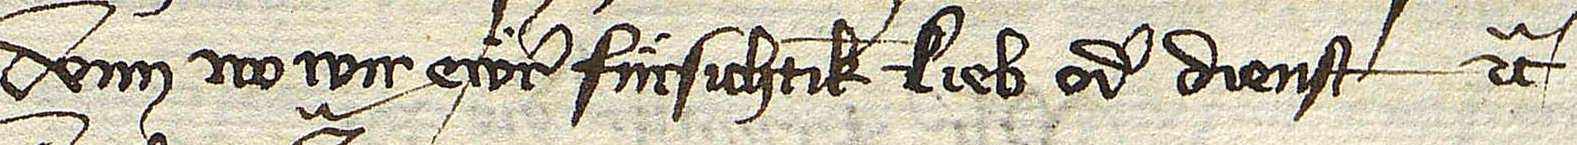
Denn wo wir ewr* fürſichtik* lieb od* dienſt ec*
